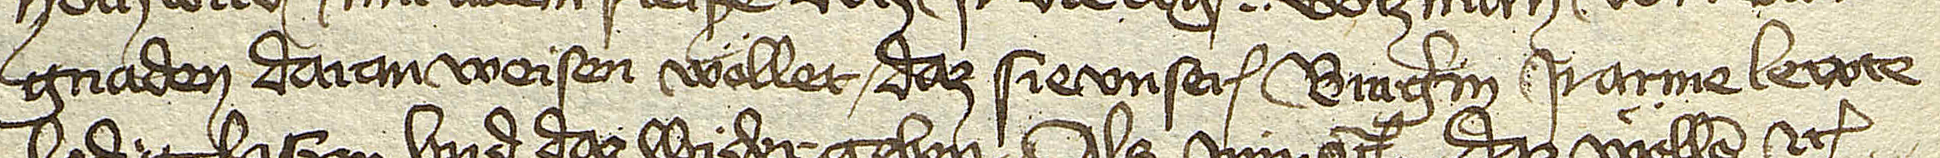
gnaden daran weiſen wöllet / daʒ ſie vnſer* Burg*in Ir arme lewte
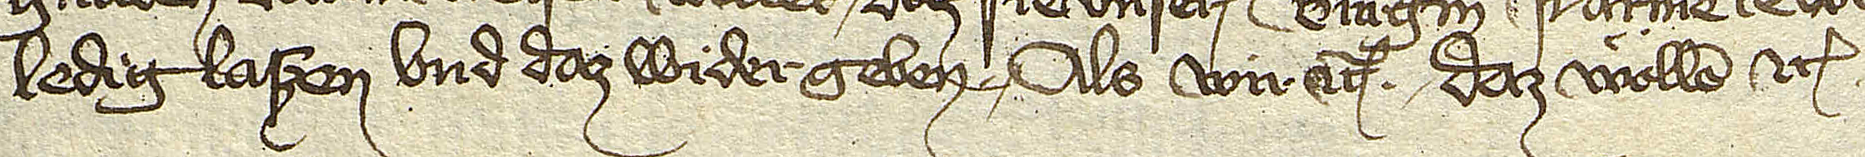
ledig laſʒen vnd daʒ wider geben / Als wir ec*. / daʒ wölle* ec*
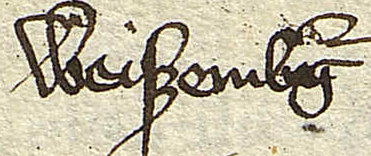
Weiſʒemb*g
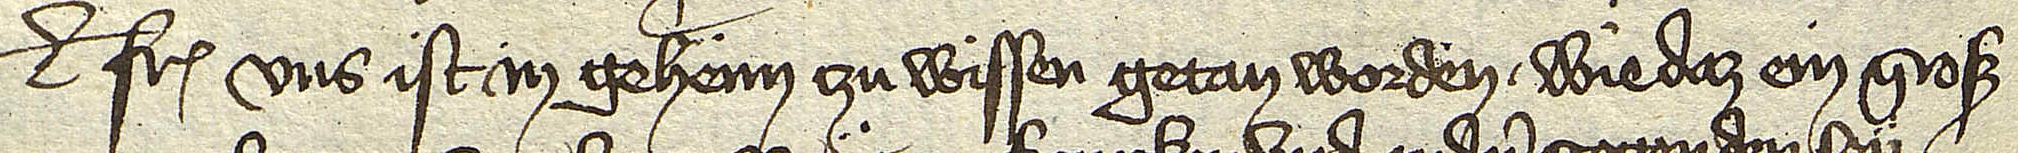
L* fr* vns iſt in geheim cʒu wiſſen getan worden / wie daʒ ein groſʒ
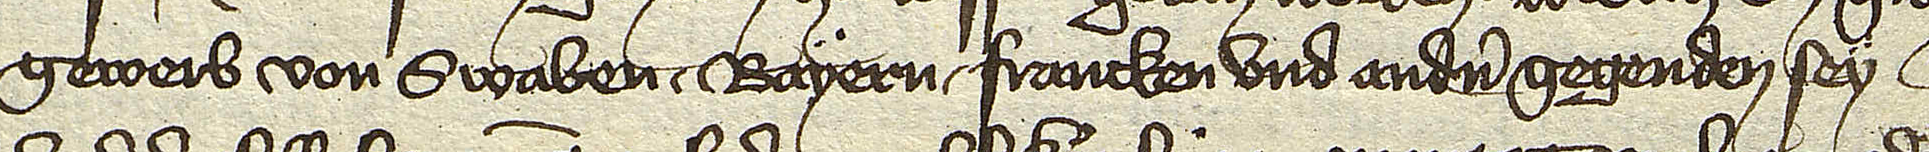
gewerb von Swaben / Bayern / francken vnd andn* gegenden ſey
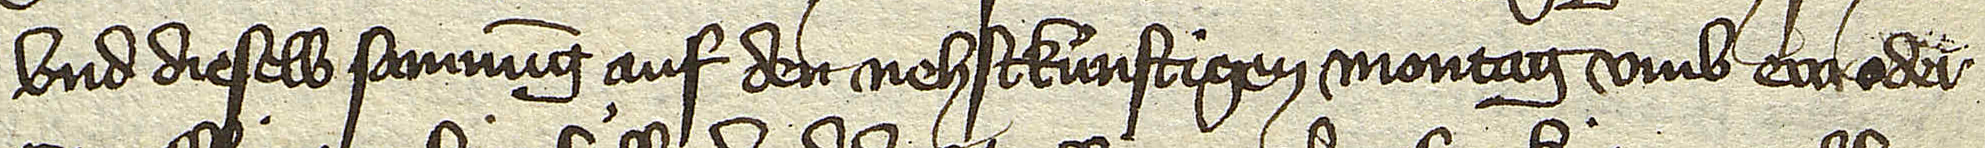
vnd dieſelb ſamnug* auf den nehſtkünftigen montag vmb ew oder
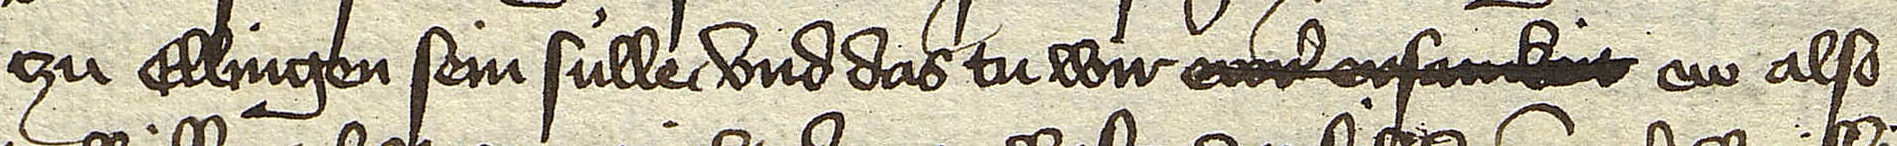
cʒu Ellingen ſein ſülle / vnd das tu wir ewr* erſamkeit ew alſo
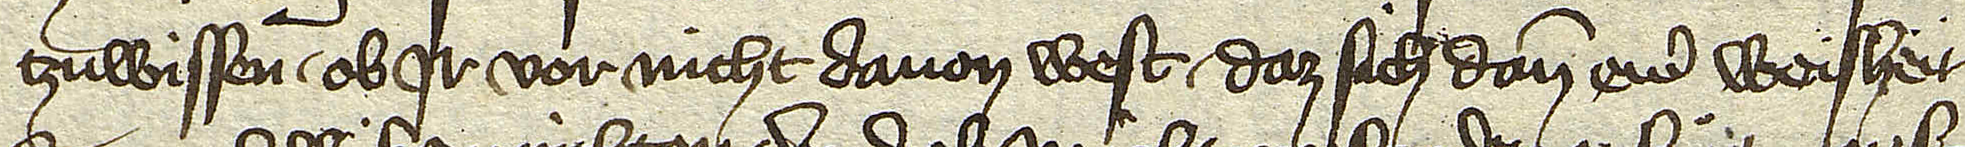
cʒuwiſſen / ob Ir vor nicht dauon weſt / daʒ ſich dan* ew* weiſheit
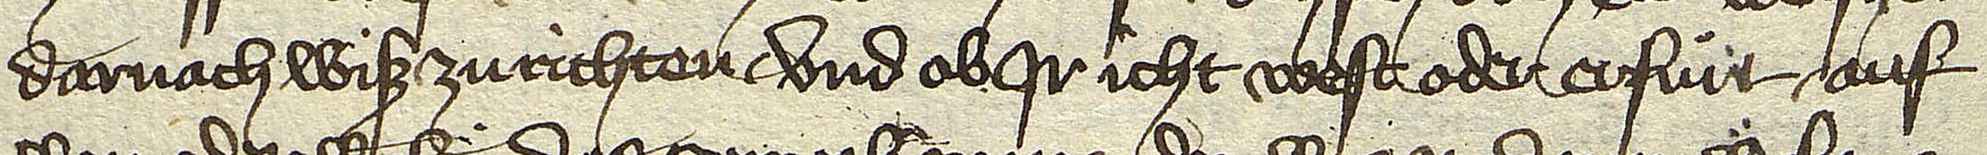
darnach wiſʒ cʒu richten / vnd ob Ir icht weſt oder erfürt / auf
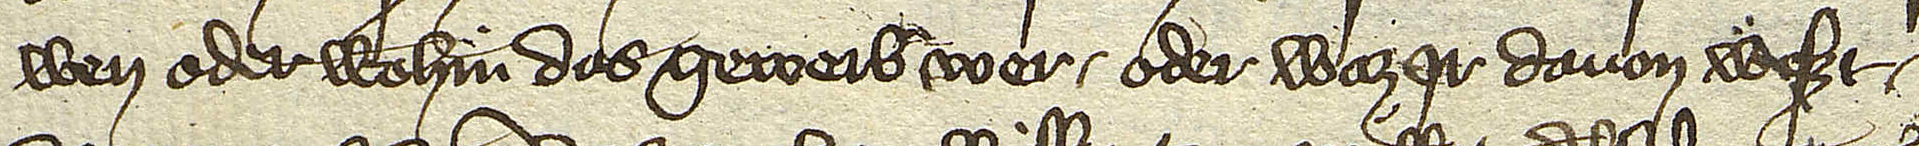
wen oder wohin das gewerb wer / oder waʒ Ir dauon wiſʒt /
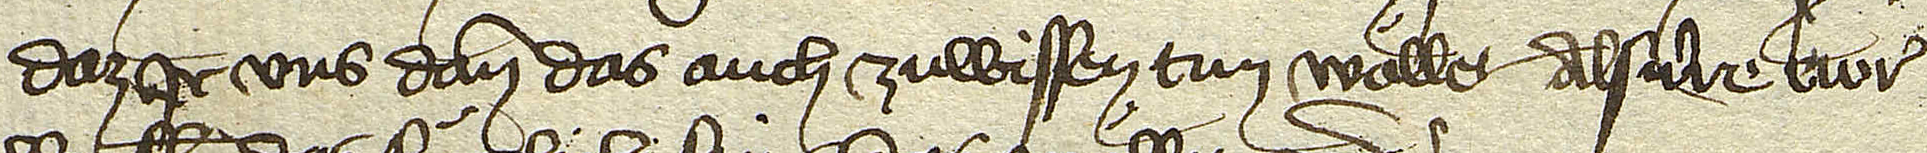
daʒ Ir vns dan* das auch cʒuwiſſen tun wöllet Als u*re ewr*
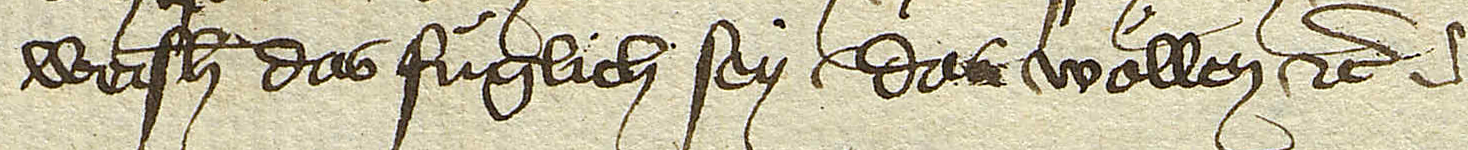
weiſh* das füglich ſey / das wöllen ec* §
